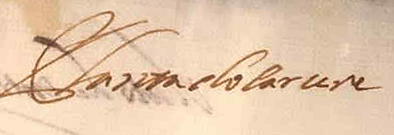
Planta do carcere
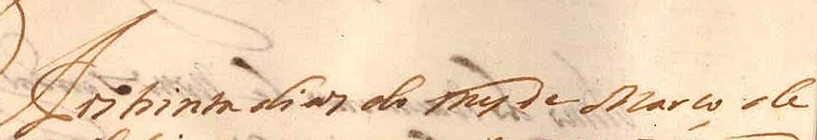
Aos trinta dias do mes de Março de
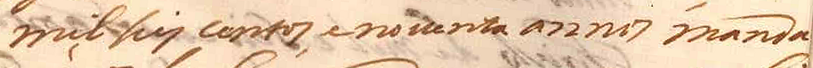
mil seiscentos, e nouenta annos manda
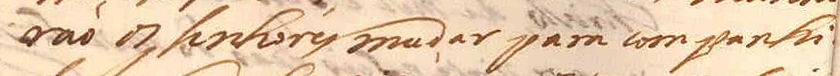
raõ os senhores mudar para companhi
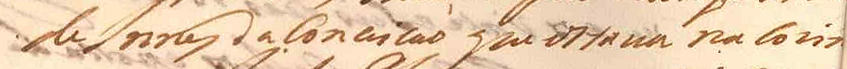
de Innes da Conceiçaõ que estaua na cozin
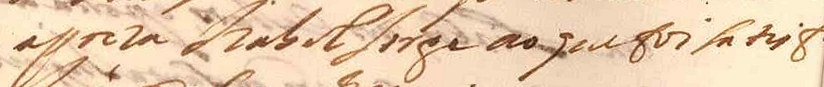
a preza Izabel Jorge ao que foi satisf
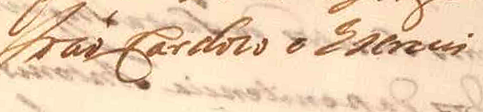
Joaõ Cardozo o Escreui
